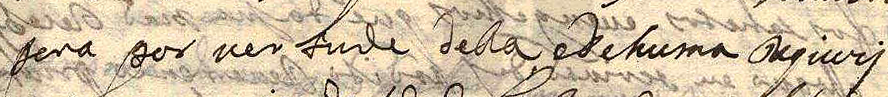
pera por uertude della e de huma Requizi
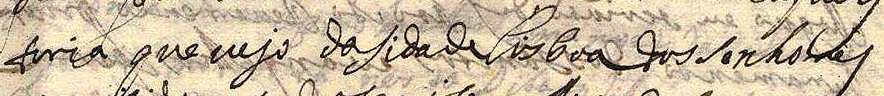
toria que uejo da sidade lisboa dos senhores
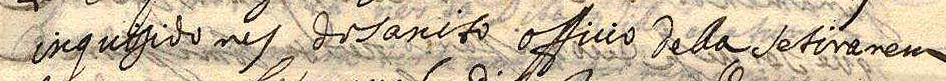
inquisidores do sancto officio della se tirarem
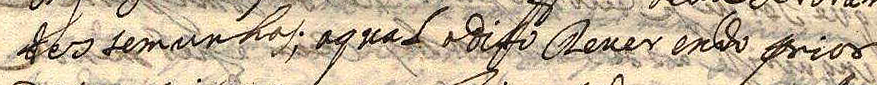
testemunhas; a qual o ditto Reuerendo prior
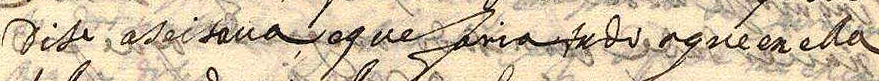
dise aseitaua o que faria tudo o que en ella
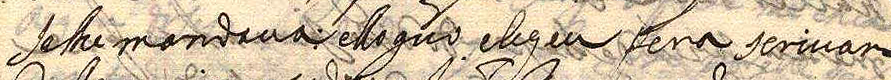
se lhe mandaua e lloguo elegeu pera scriuam
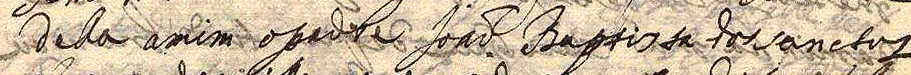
della a mim o padre joaõ Baptista dos sanctos
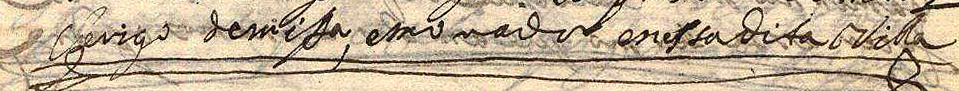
Clerigo de missa, e morador e nesta dita Villa
